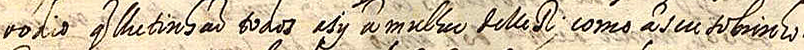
o odio q̄ lhe tinhão todos asy â mulher delle R; como â seu sobrinho;
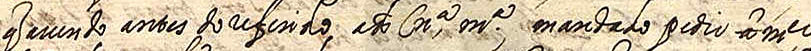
q̄ auendo antes do referido a d̄ Cna, ma., mandado pedir â mer
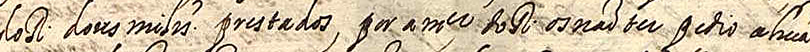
do R. dous mil rs̄. prestados, por a mer, do R. os naõ ter pedio a huā
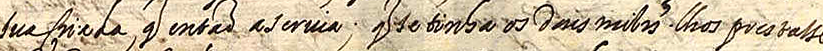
sua Criada, q̄ então a seruia; q̄ se tinha os dous mil rs̄ lhos prestasse
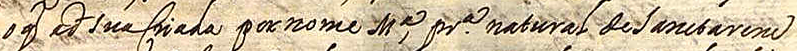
o q̄ a d̄ sua Criada por nome Ma pra. natural de Sanctarem
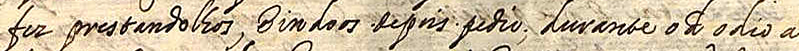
fez prestandolhos, e indoos depois pedir, durante o d̄ odio á
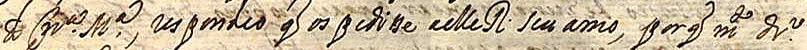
d̄ Cna. Ma., respondeo q̄ os pedisse a elle R. seu amo, porq̄ mto dr.o
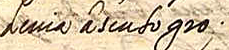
deuia â seu sogro;
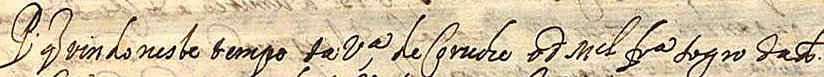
P. q̄ vindo neste tempo da Va, de Coruche o d̄ Mel fra Sogro da d̄
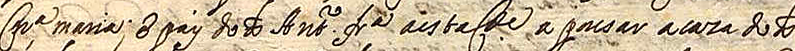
Cna, maria; e pay do d̄ Anto. fra a esta Cde. a pousar a caza do d̄
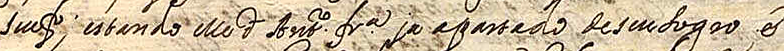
seu fo; estando elle d̄ Anto. fra. ja apartado de seu Sogro; e
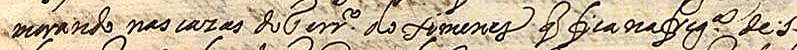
morando nas cazas do Terr.o do Ximenez q̄ fica na freg.a de S.
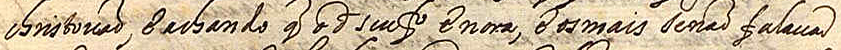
christouão, e achando q̄ o d̄ seu fo e nora, e os mais se não falauão
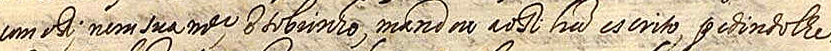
com o R: nem sua mer, e sobrinho, mandou ao R, hū escrito, pedindolhe
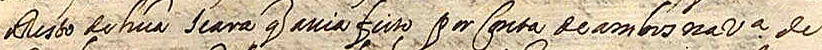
o Resto de hūa Seara q̄ auia feito por Conta de ambos na Va. de
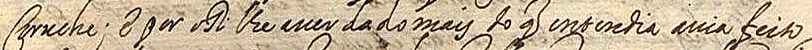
Coruche; e por o R. lhe auer dado mais do q̄ entendia auia feito
